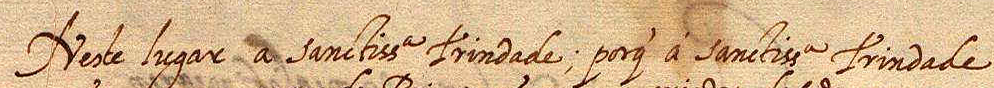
Neste lugar a sanctissa Trindade; porq̄ á sanctissa Trindade
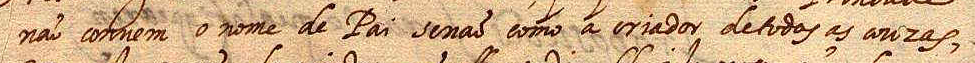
naõ conuem o nome de Pai senaõ como a criador de todas as couzas,
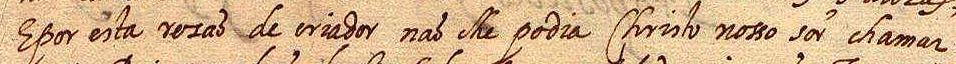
E por esta rezaõ de criador naõ lhe podia Christo nosso sor̄ chamar
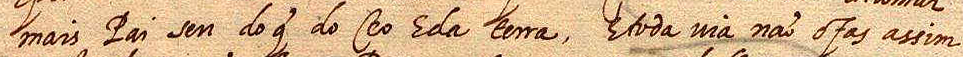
mais Pai seu do q̄ do Ceo E da terra, E todauia naõ o fas assim
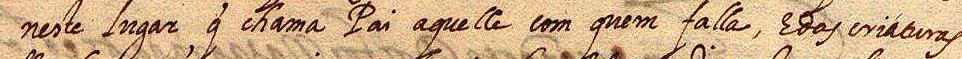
neste lugar q̄ chama Pai aquelle com quem falla, E das criaturas
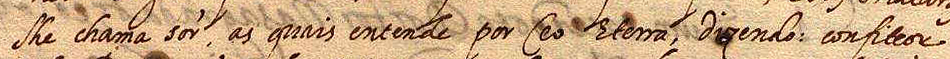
lhe chama sor̄, as quais entende por Ceo E terra, dizendo: confiteor
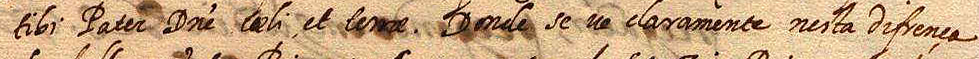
tibi Pater Dnē cæli et terræ. Donde se ue claramente nesta difrença
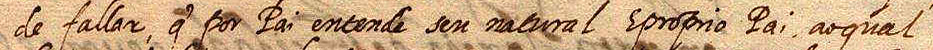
de fallar, q̄ por Pai entende seu natural E proprio Pai ao qual
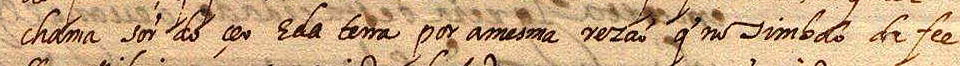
chama sor̄ do ceo E da terra por a mesma rezaõ q̄ no simbolo da fee
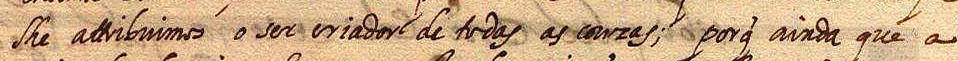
lhe attribuimos o ser criador de todas as couzas; porq̄ ainda que a
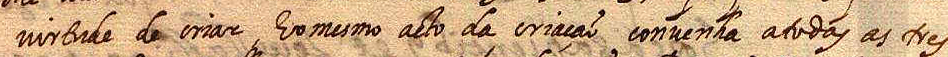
uirtude de criar, E o mesmo acto da criação conuenha a todas as tres
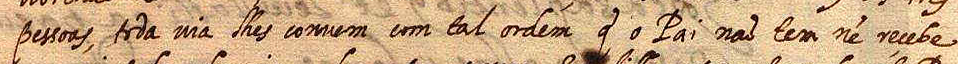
pessoas, todauia lhes conuem com tal ordem q̄ o Pai naõ tem nē recebe
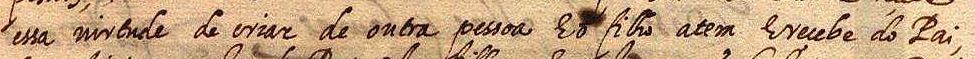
essa uirtude de criar de outra pessoa e o filho a tem E recebe do Pai,
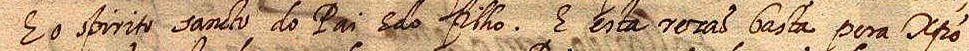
E o spirito sancto do Pai E do filho. E esta rezaõ basta pera Xpō
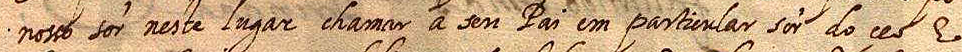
nosso sor̄ neste lugar chamar a seu Pai em particular sor̄ do ceo E
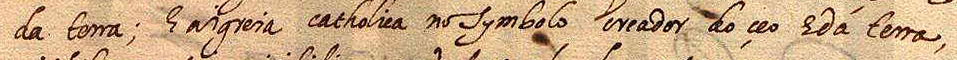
da terra; E a igreia catholica no Symbolo creador do ceo E da terra,
